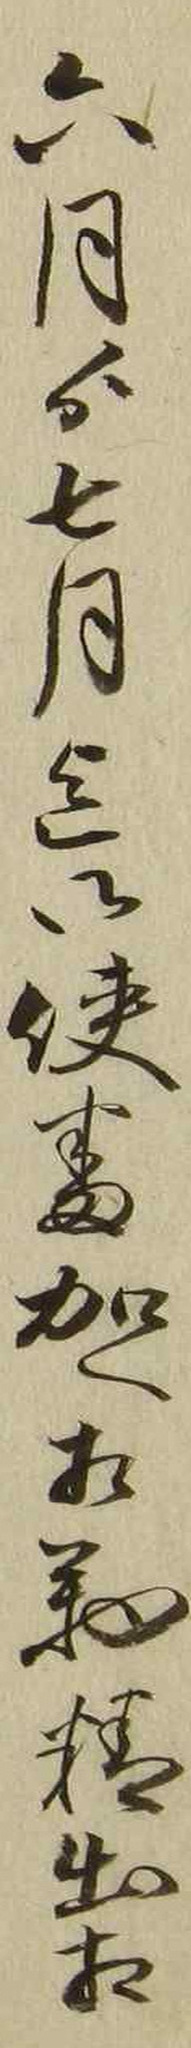六月ゟ七月迄御使番加へ相勤精出相
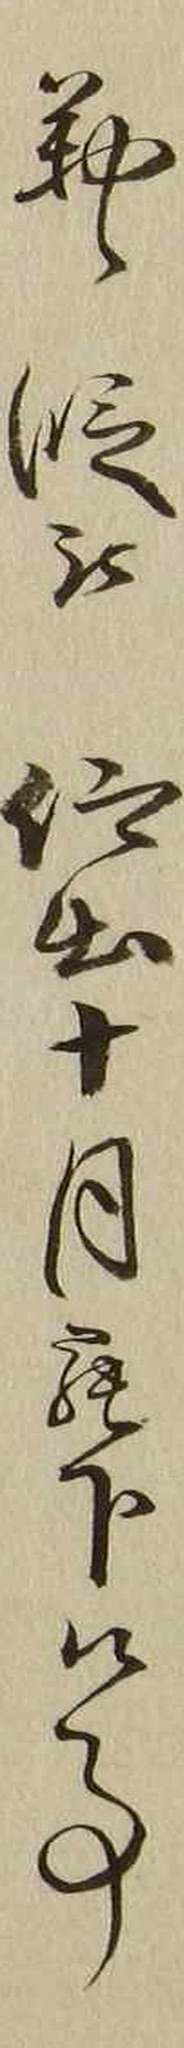勤候段被仰出十月罷下候事
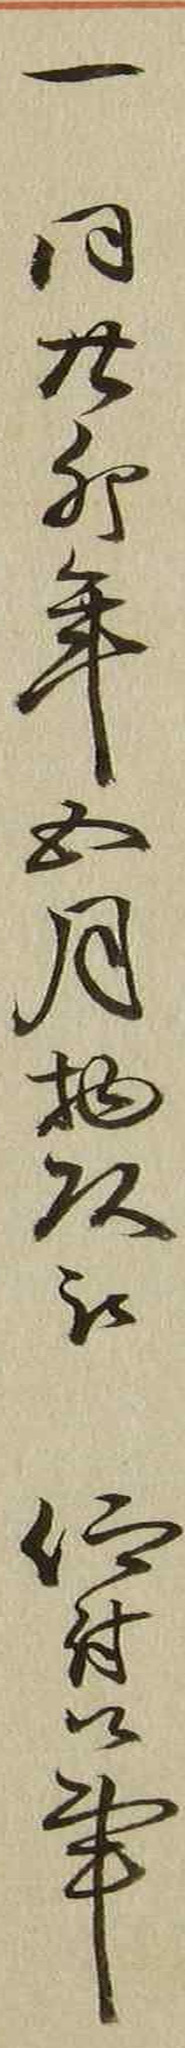一同廿卯年五月物頭被仰付候事
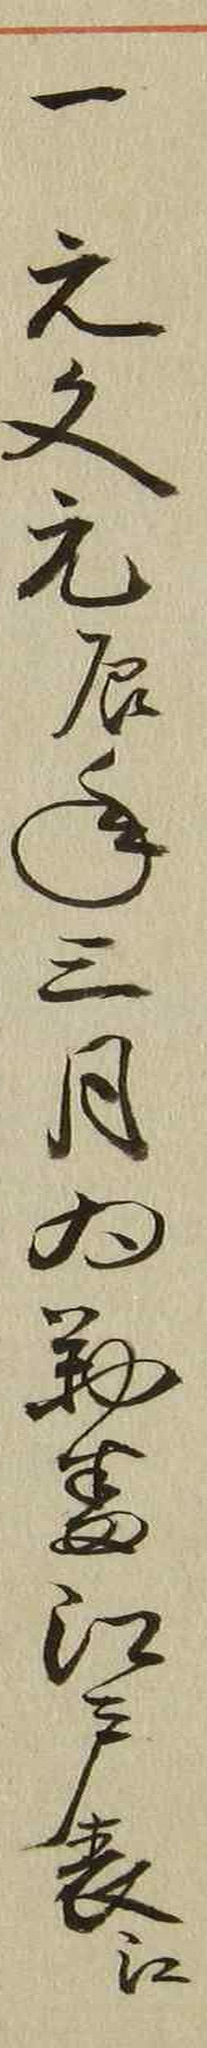一元文元辰年三月為勤番江戸表江
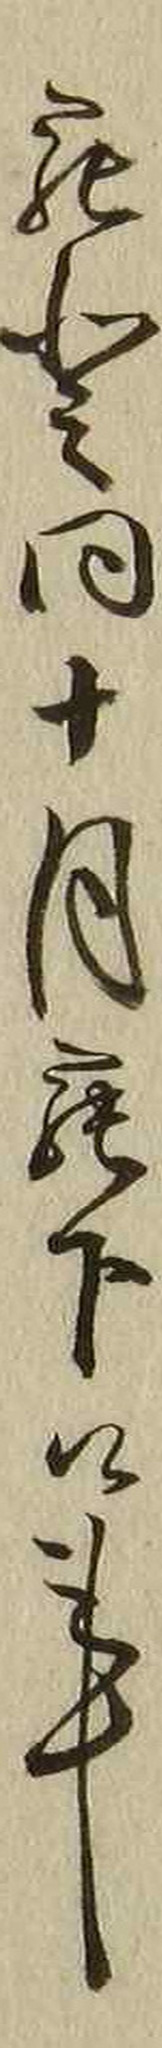罷登同十月罷下候事
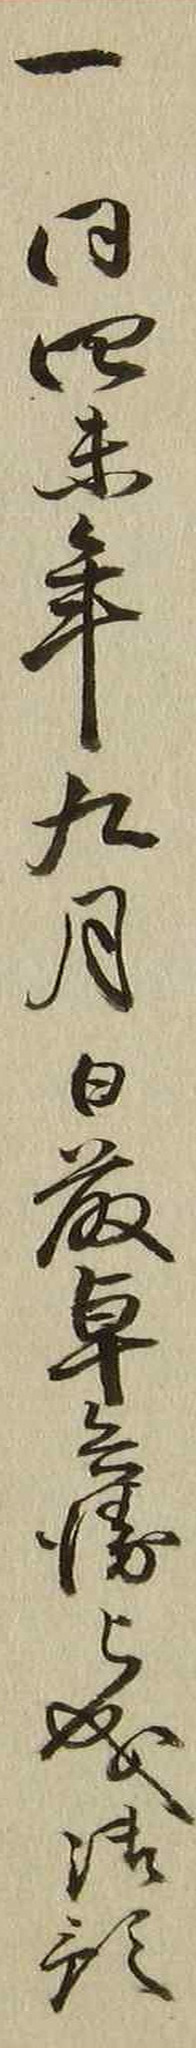一同四未年九月日藤卓兵衛被成御預
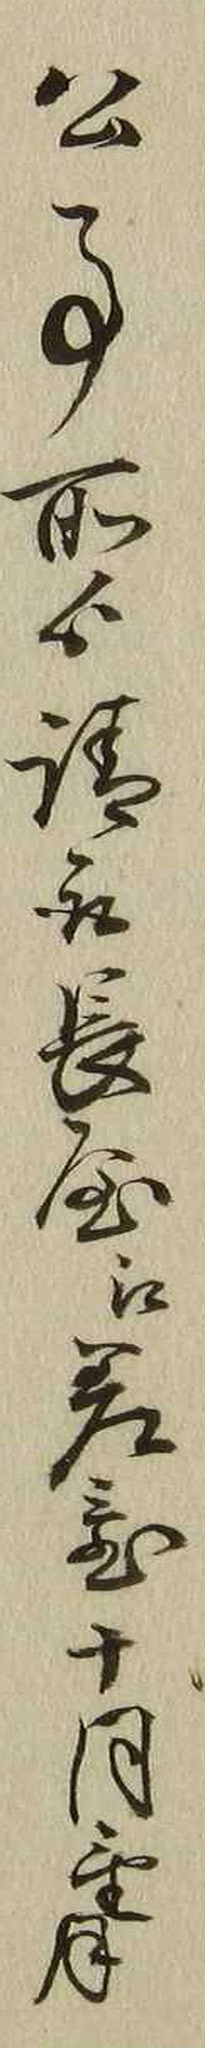公事所ゟ請取長屋江差置十月望月
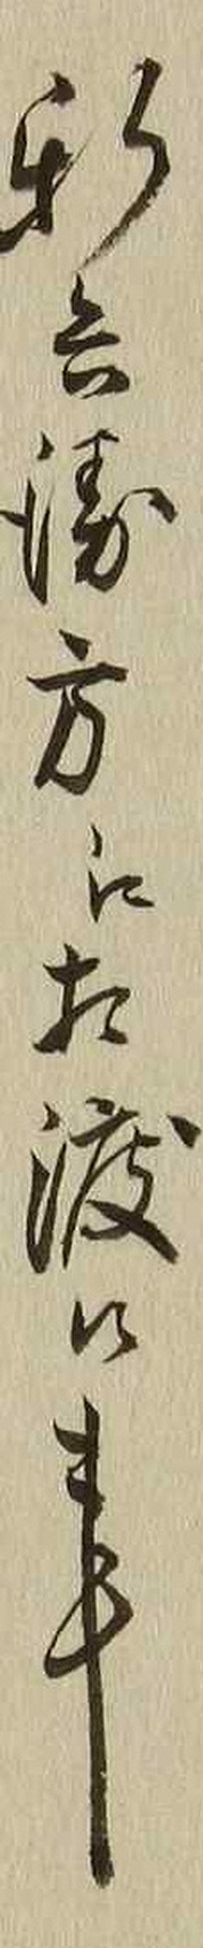新兵衛方江相渡候事
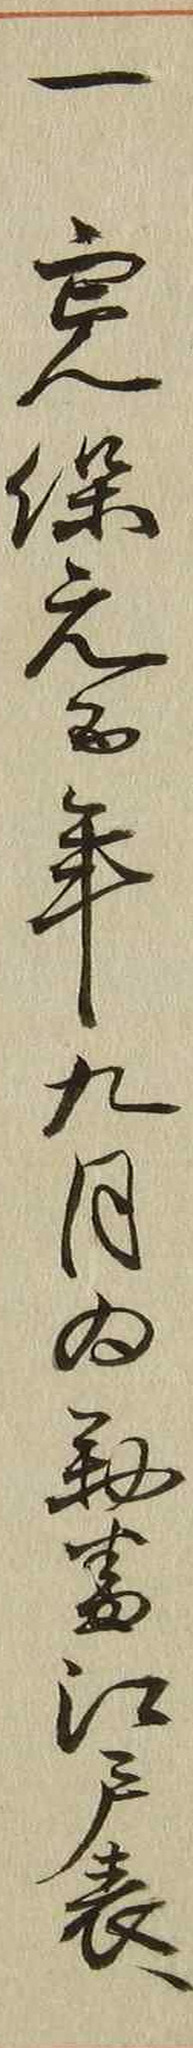一寛保元酉年九月為勤番江戸表へ
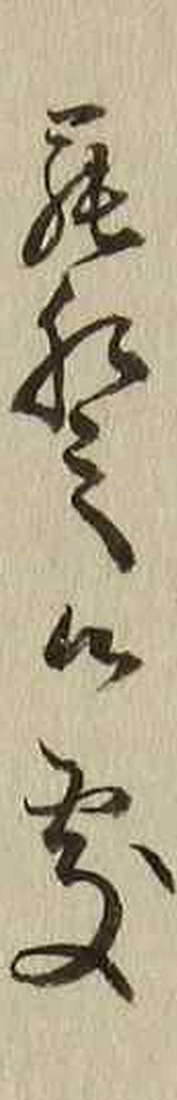罷登候処
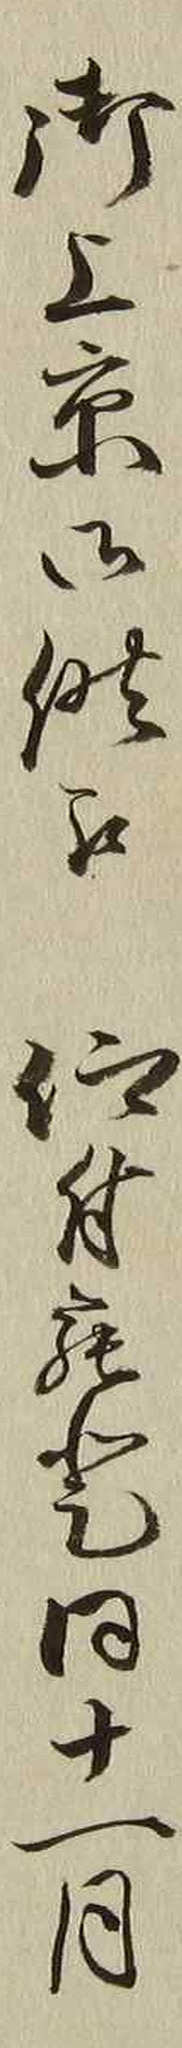御上京御供被仰付罷登同十一月
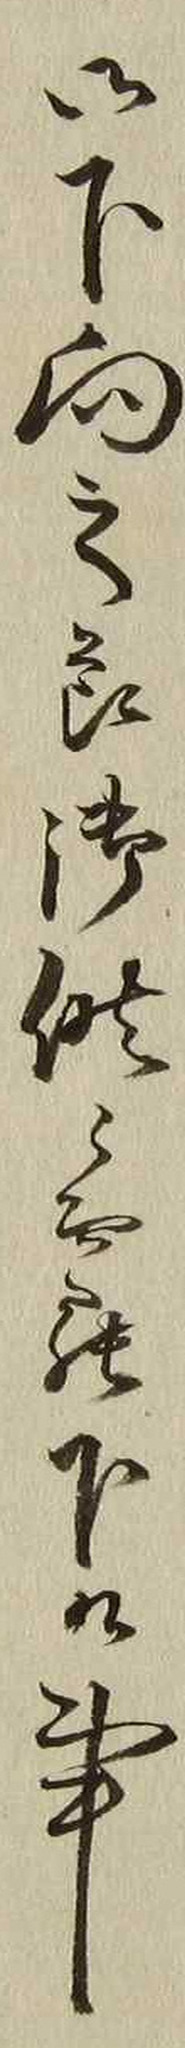御下向之節御供ニ而罷下候事
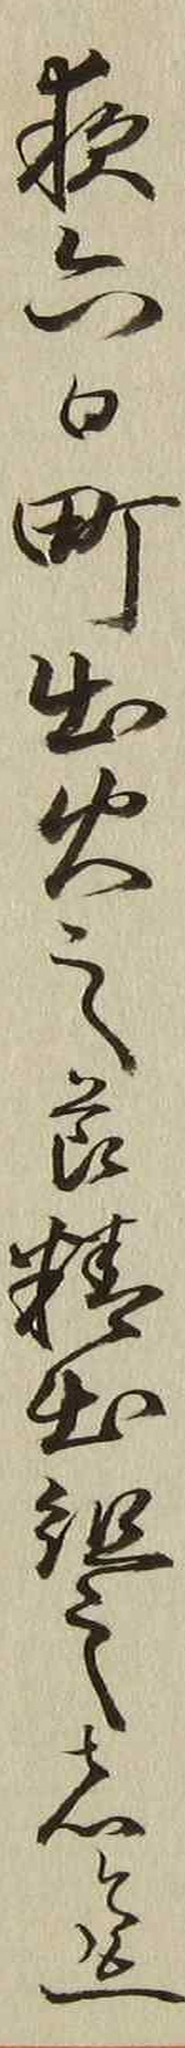夜六日町出火之節精出組之者迄
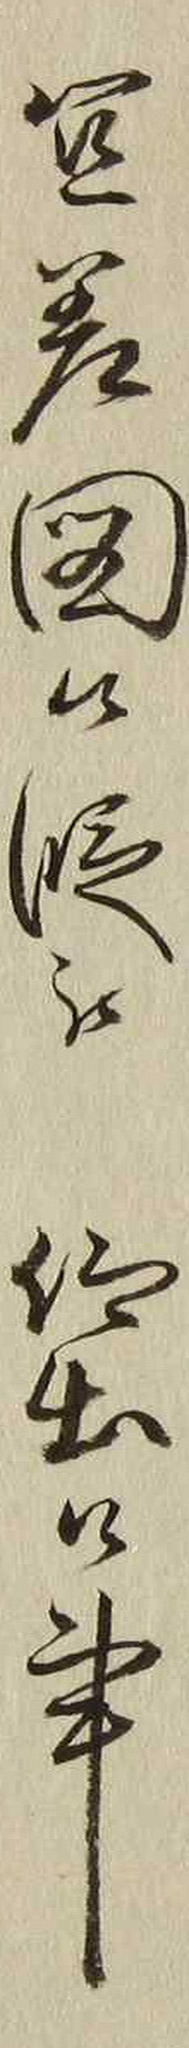宜差図候段被仰出候事
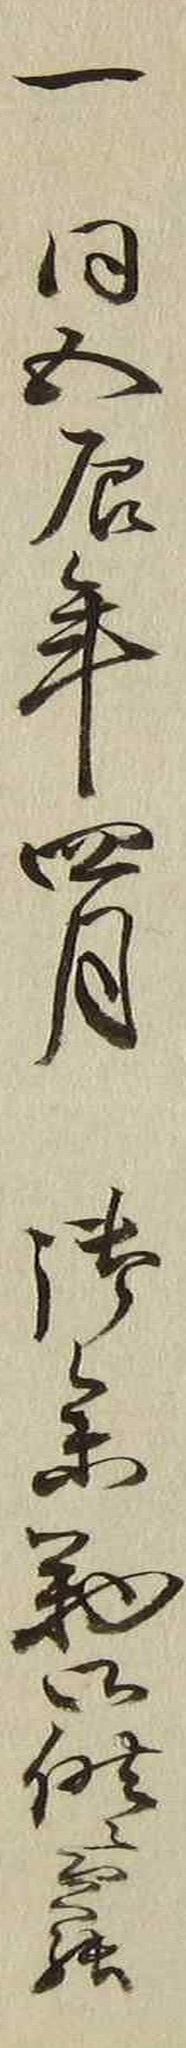一同五辰年四月御参勤御供ニ而罷
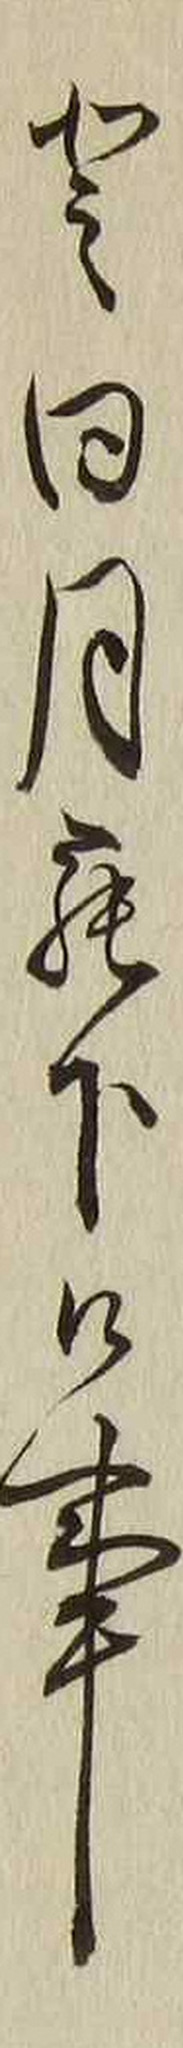登同月罷下候事
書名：諸士系譜　巻之60　と之部3
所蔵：会津若松市立会津図書館
